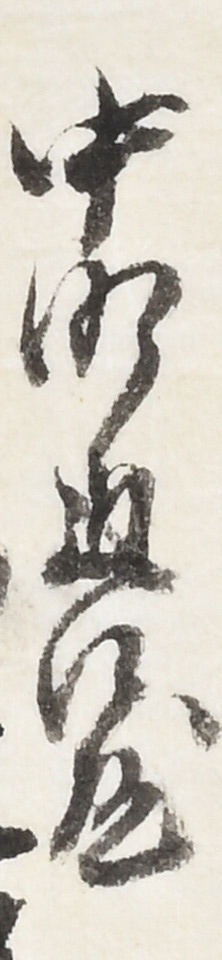中町近江屋
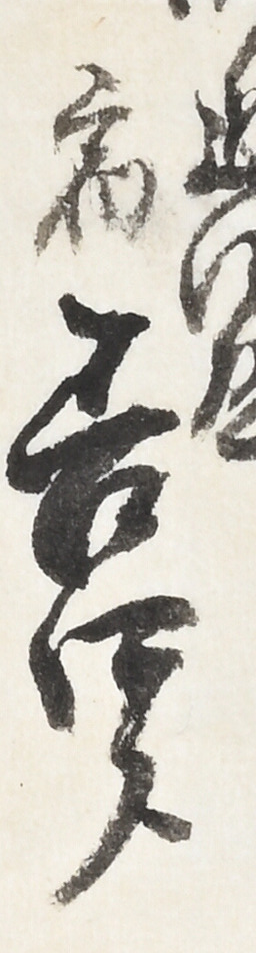宿善四郎
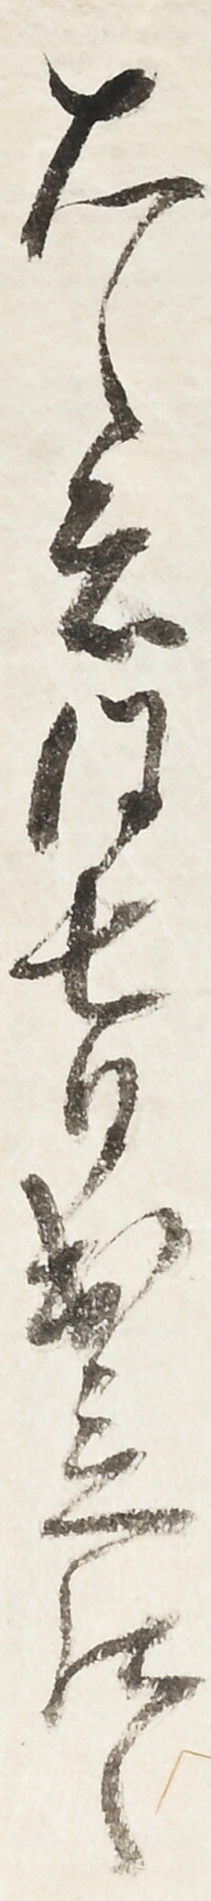右之者同七日出立仕候
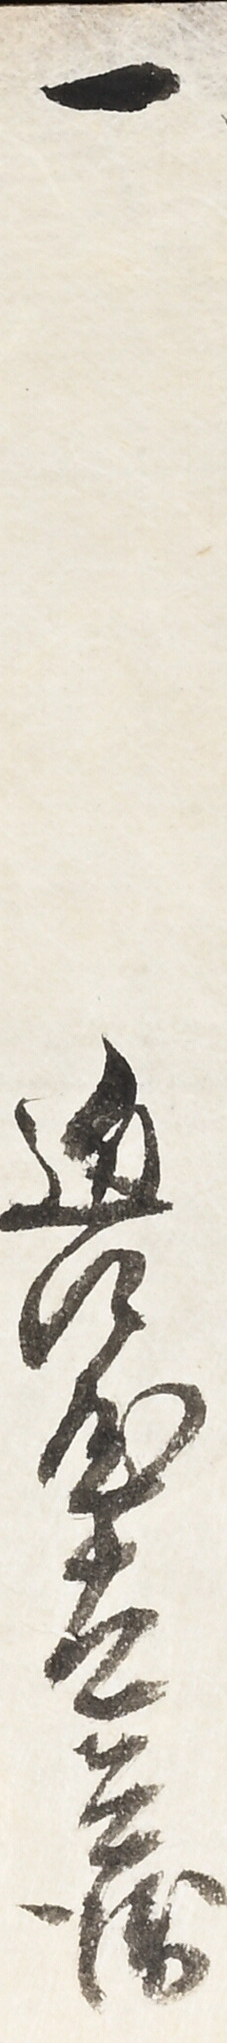一近江屋太兵衛
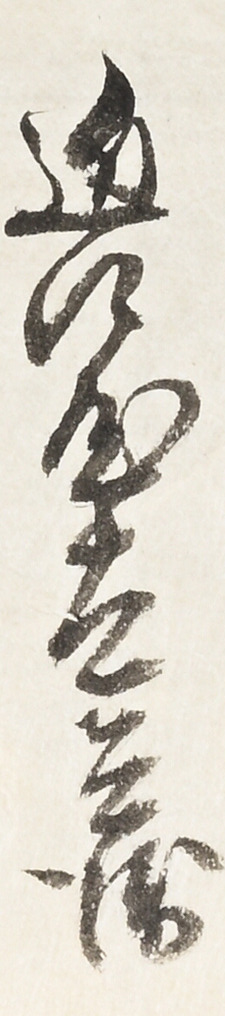一近江屋太兵衛
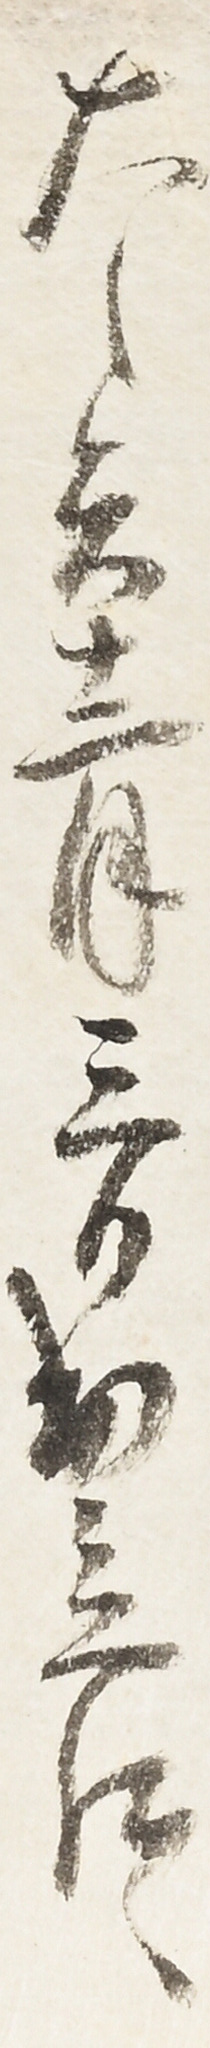右之者十二月三日出立仕候
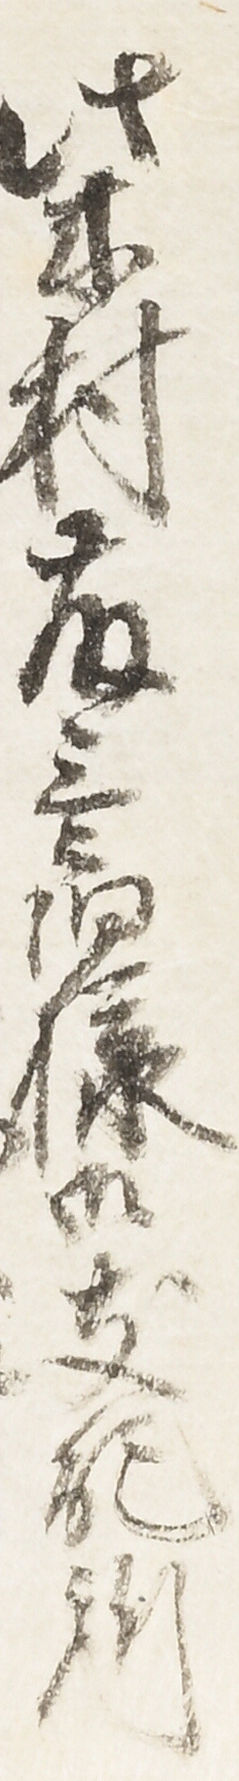柴村藤三郎様御支配所
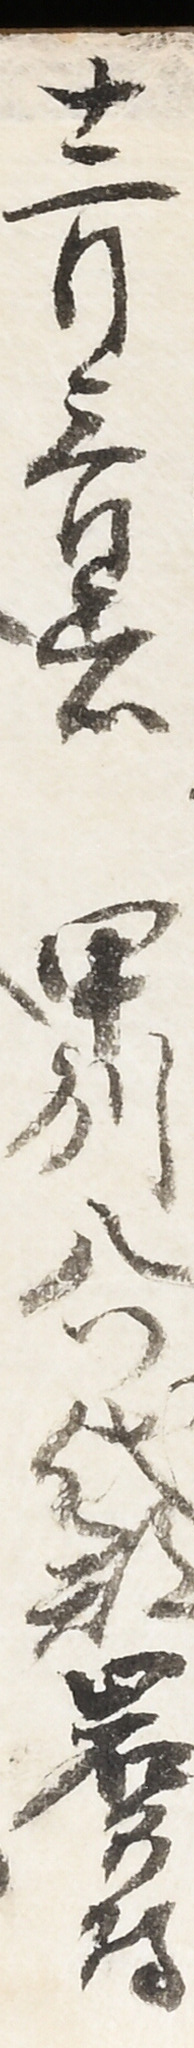十二月三日着甲州八ツ代郡岩間村
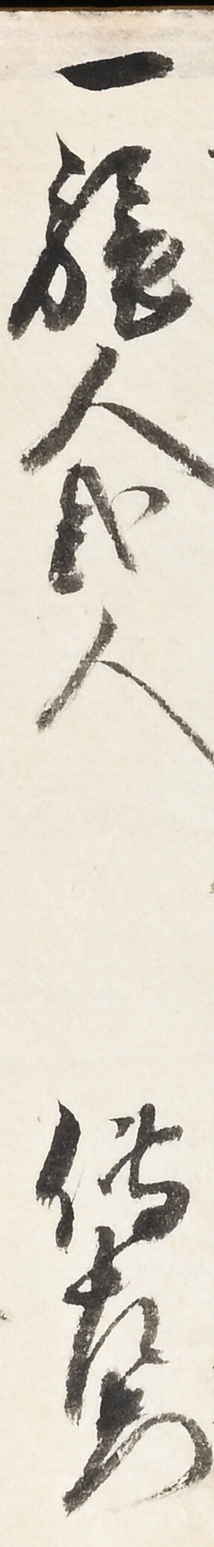一旅人弐人伝左衛門
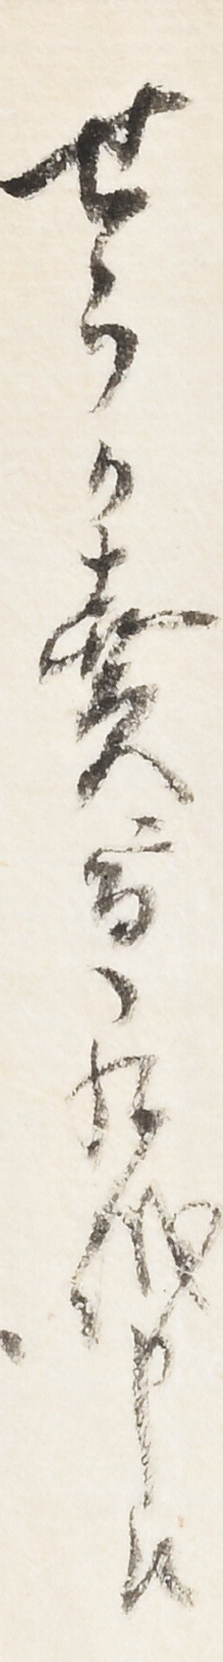せうか売ニ而罷越申候
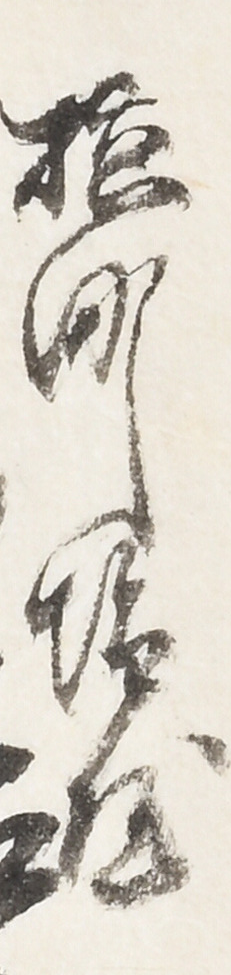横町塩屋
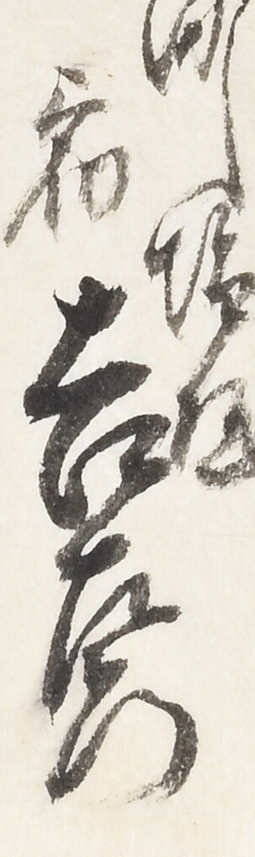治郎左衛門
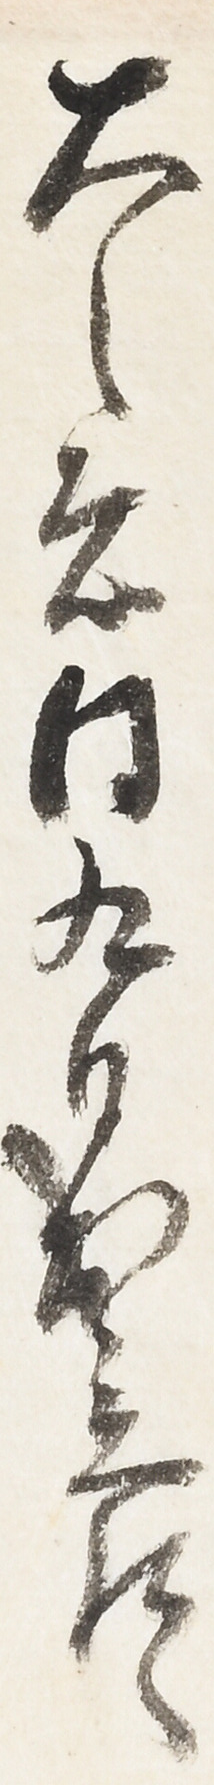右之者同九日出立仕候
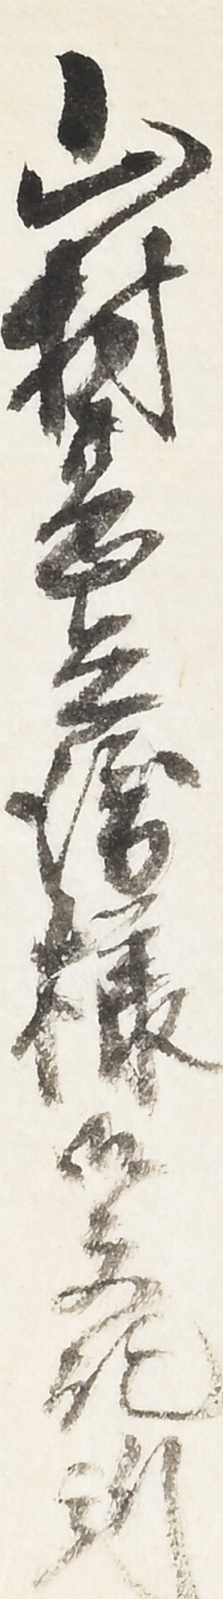山村甚兵衛様御支配所
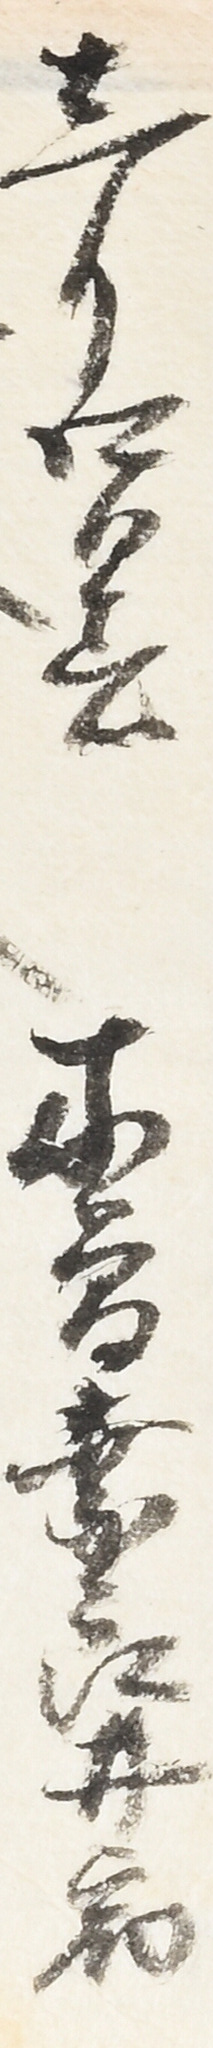十二月四日着木曽奈良井宿
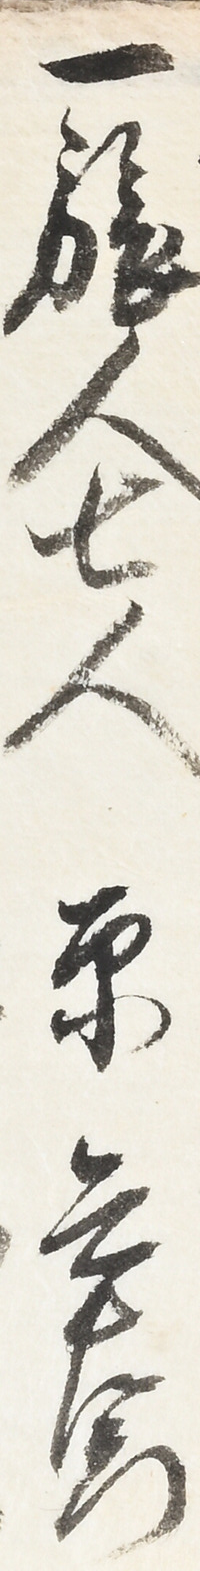一旅人七人原兵右衛門
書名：旅人泊控帳
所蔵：伊那市立高遠町図書館・合同会社AMANE
